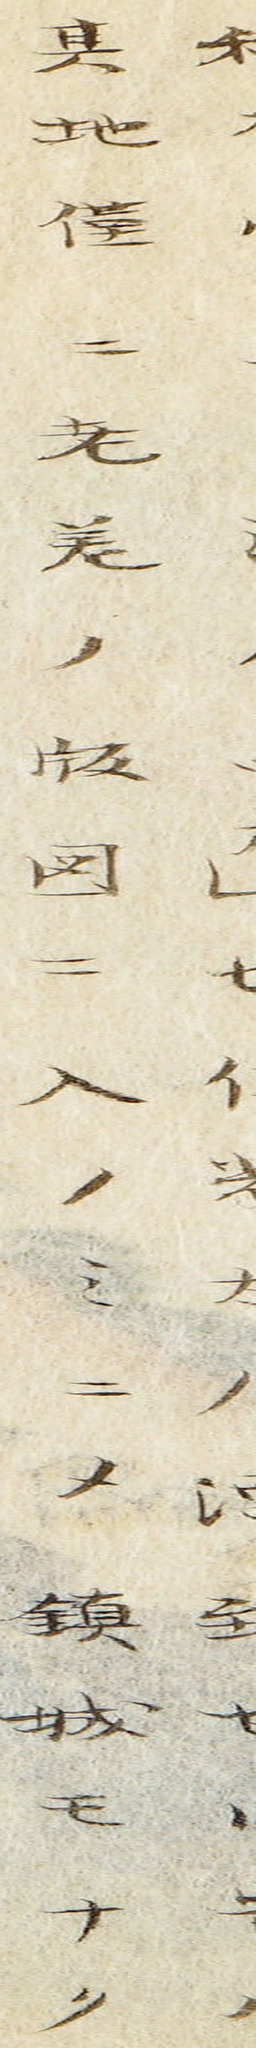其地僅ニ老ノ版図ニ入ノミニシテ鎮城モナク
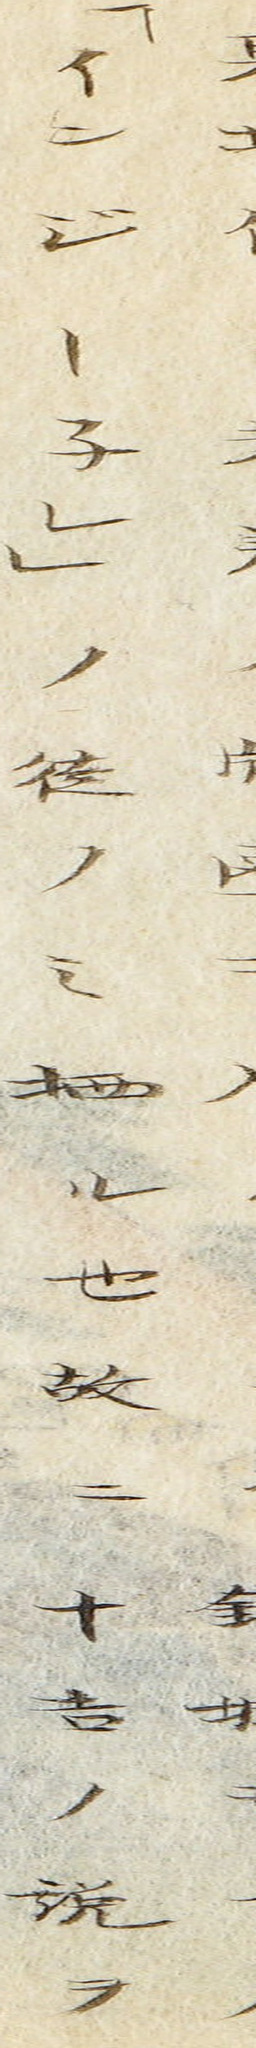「インジー子レ」ノ徒ノミ栖ル也故ニ十吉ノ説ヲ
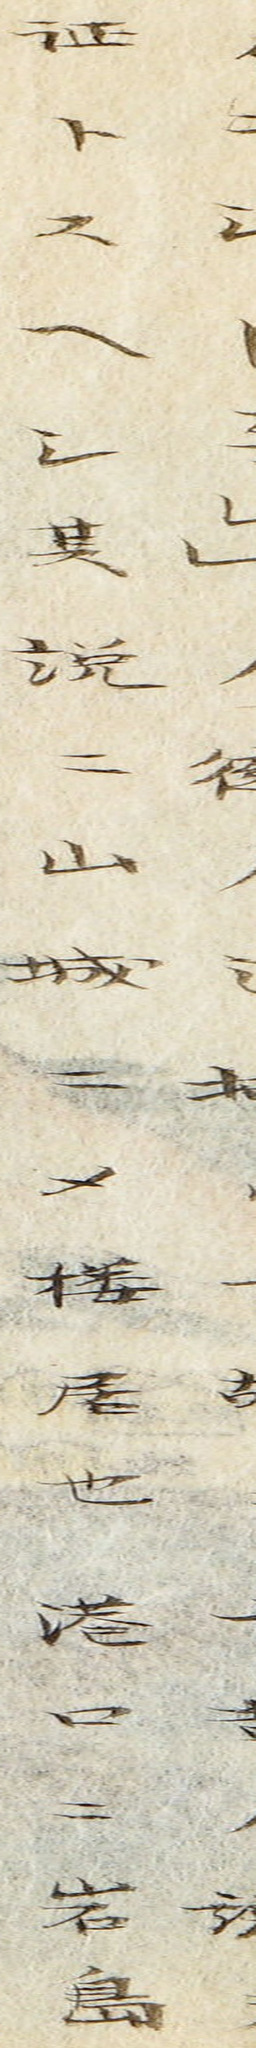証トスヘシ其節ニ山城ニシテ楼居也港口ニ岩島
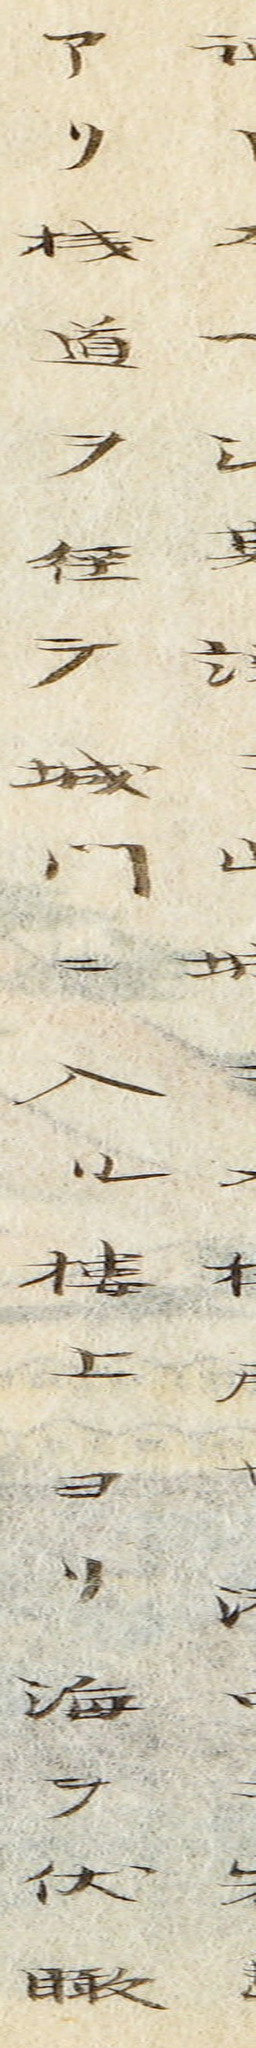アリ桟道ヲ経テ城門ニ入ル楼上ヨリ海ヲ伏瞰
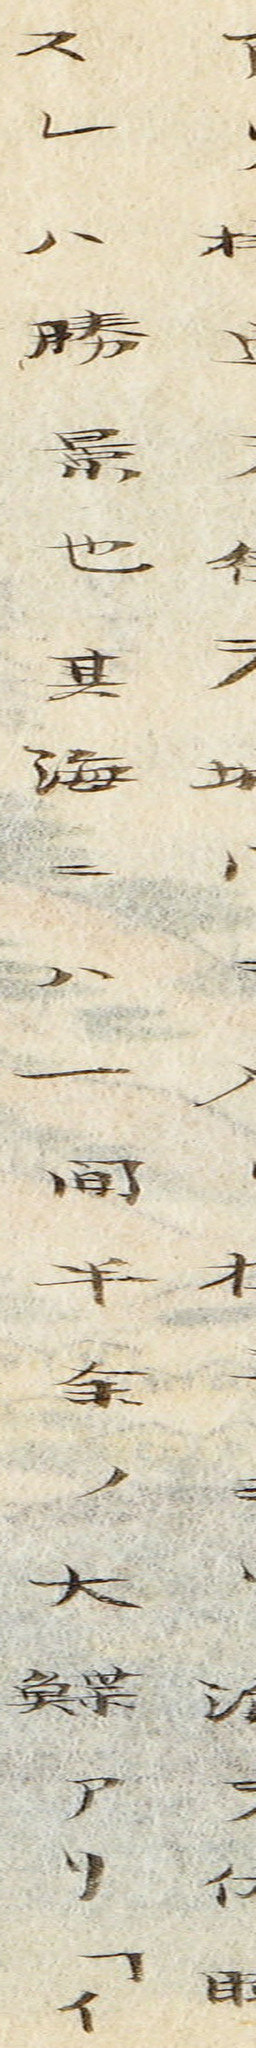スレハ勝景也其海ニハ一間半余ノ大鰈アリ「イ
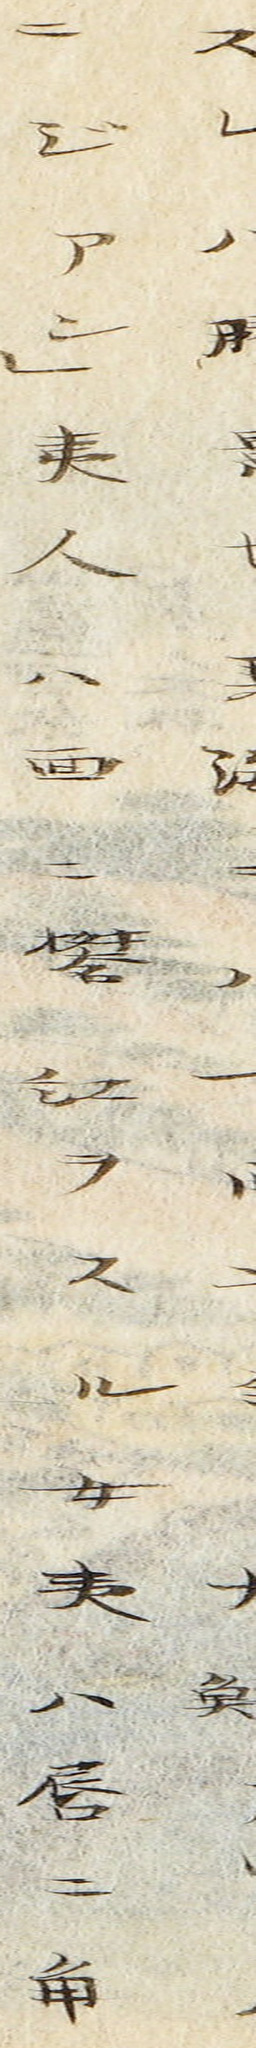ニジアン」夷人ハ面ニ礬紅ヲスル女夷ハ唇ニ角
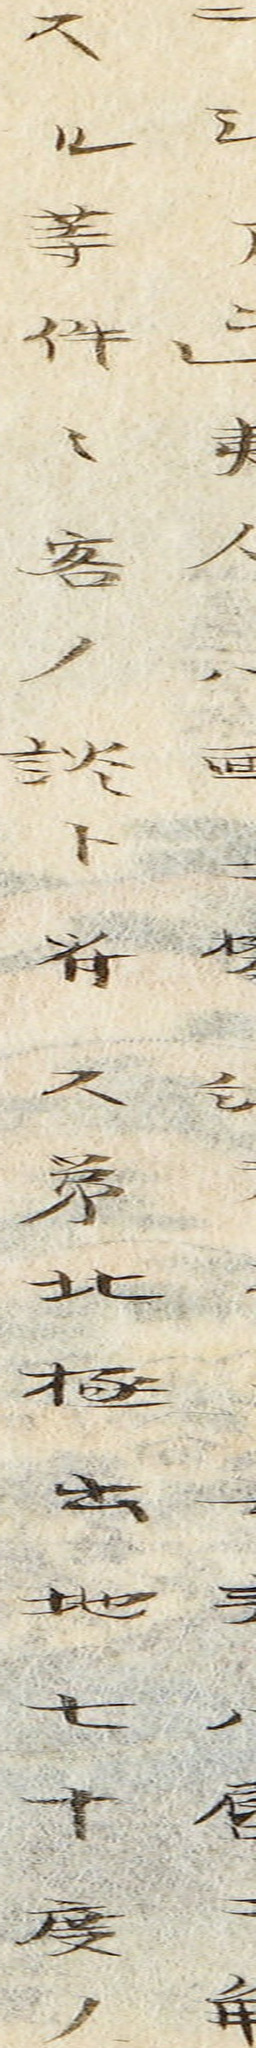スル等件々客ノ談ト符ス第北極出地七十度ノ
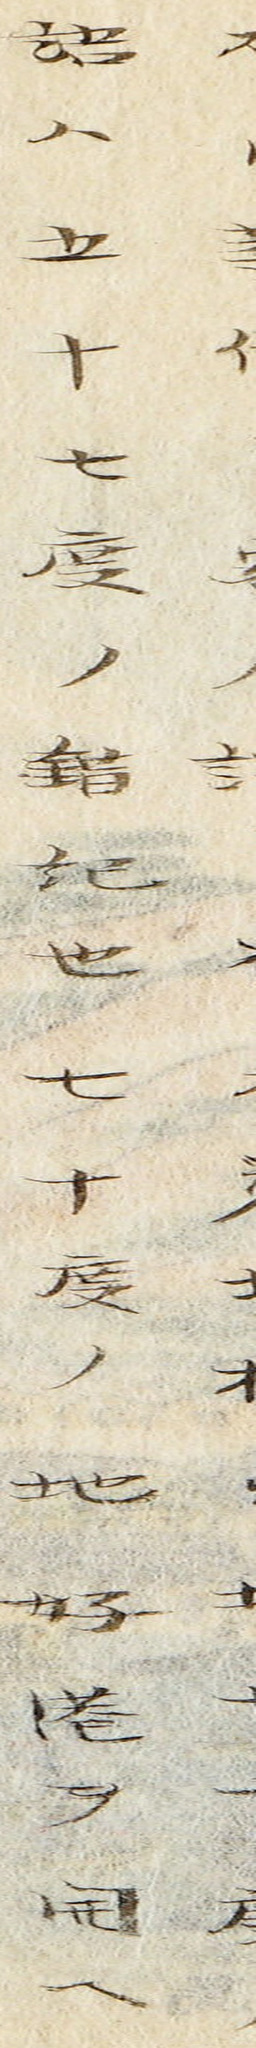語ハ五十七度ノ錯記也七十度ノ地好港ヲ開ヘ
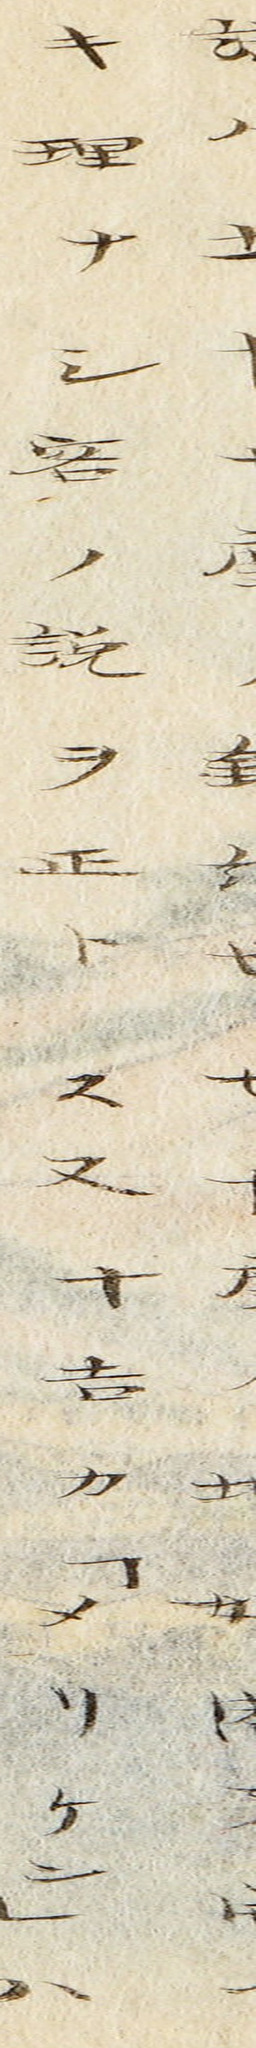キ理ナシ客ノ説ヲ正トス又十吉カ「メリケン」ハ
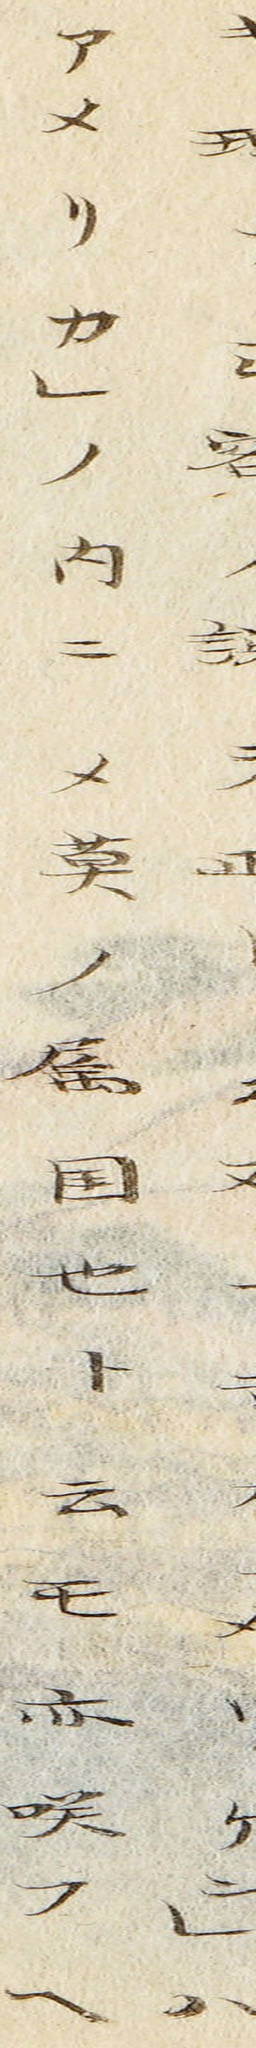アメリカ」ノ内ニシテ莫ノ属国也ト云モ亦咲フヘ
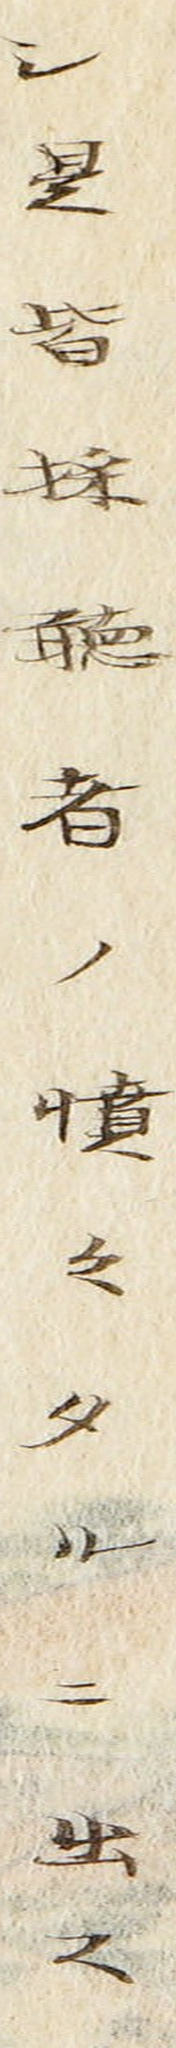シ是皆採聴者ノ憤々タルニ出ス
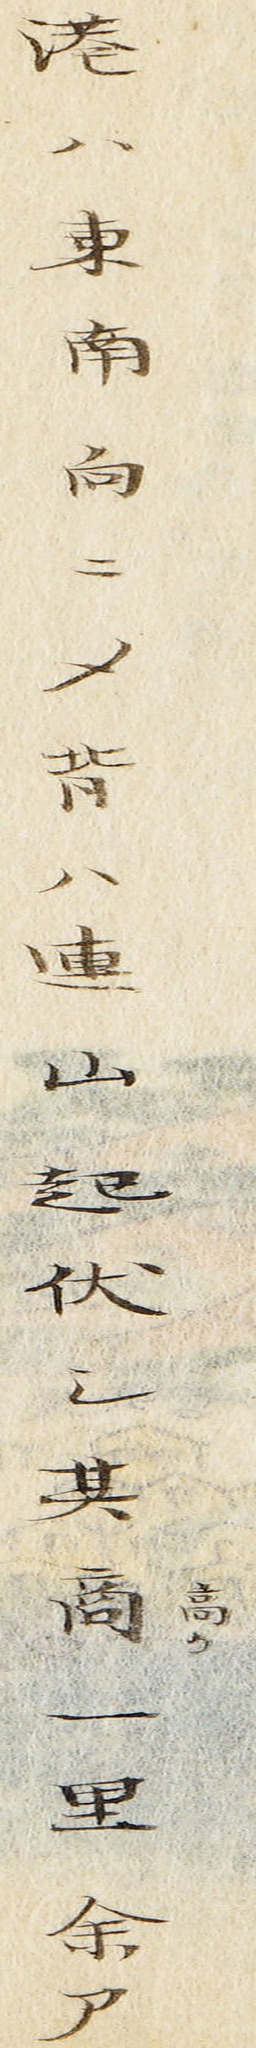港ハ東南向ニシテ背ハ連山起伏シ其商一里余ア
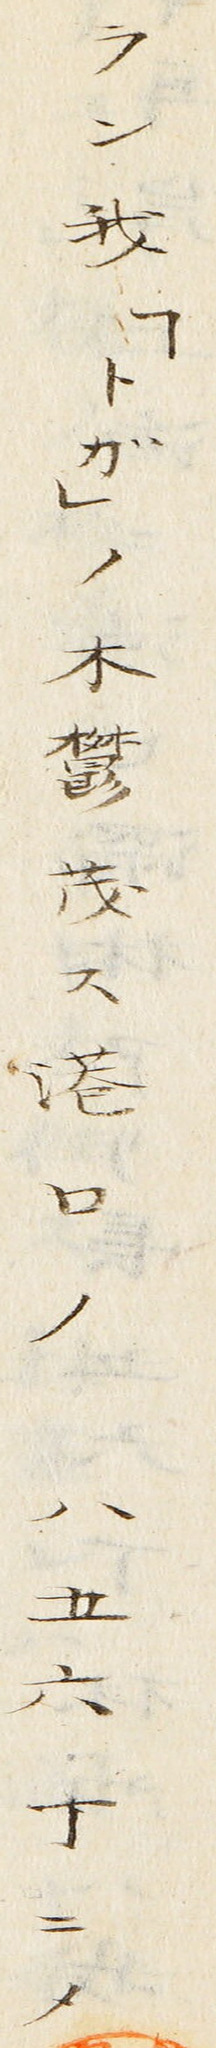ラン我「トガ」ノ木鬱茂ス港口ノハ五六丁ニシテ
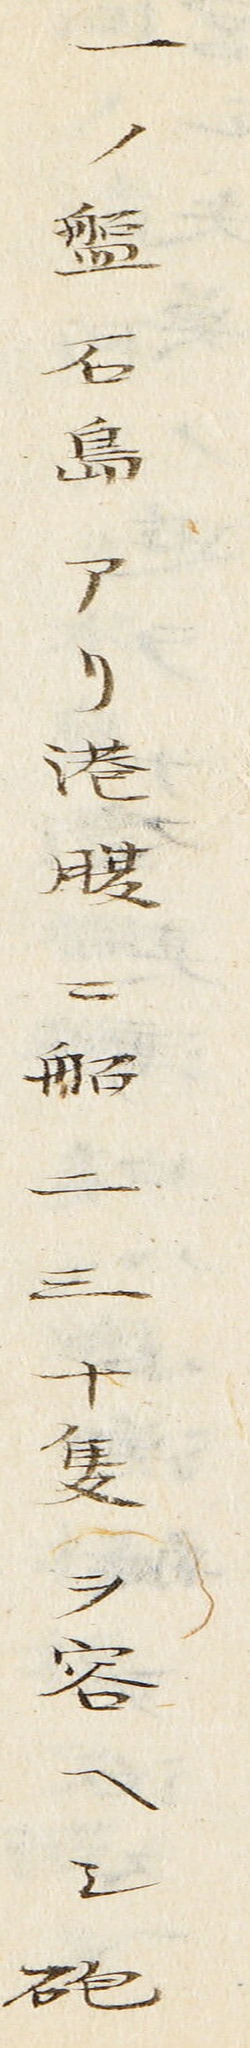一ノ盤石島アリ港腹ニ船二三十隻ヲ容ヘシ砲
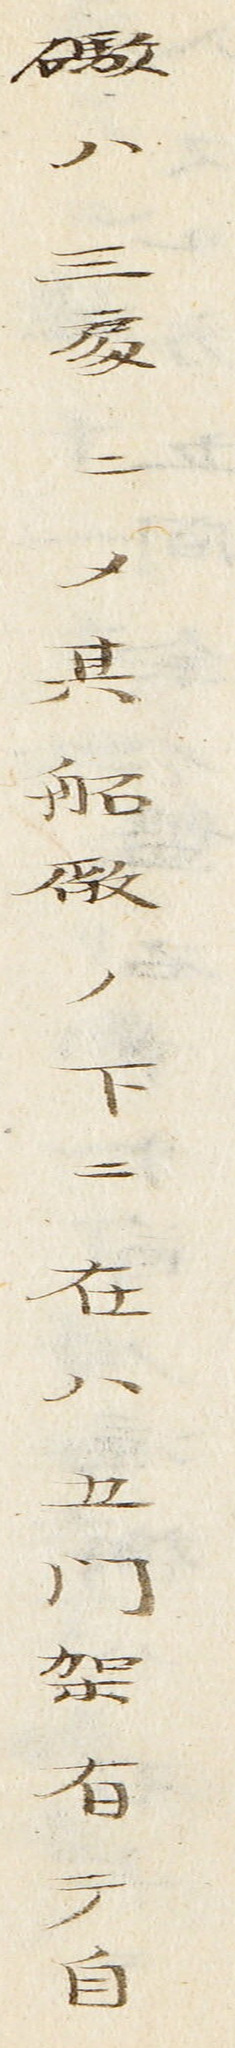礟ハ三処ニシテ其船厰ノ下ニ在ハ五門架有テ自
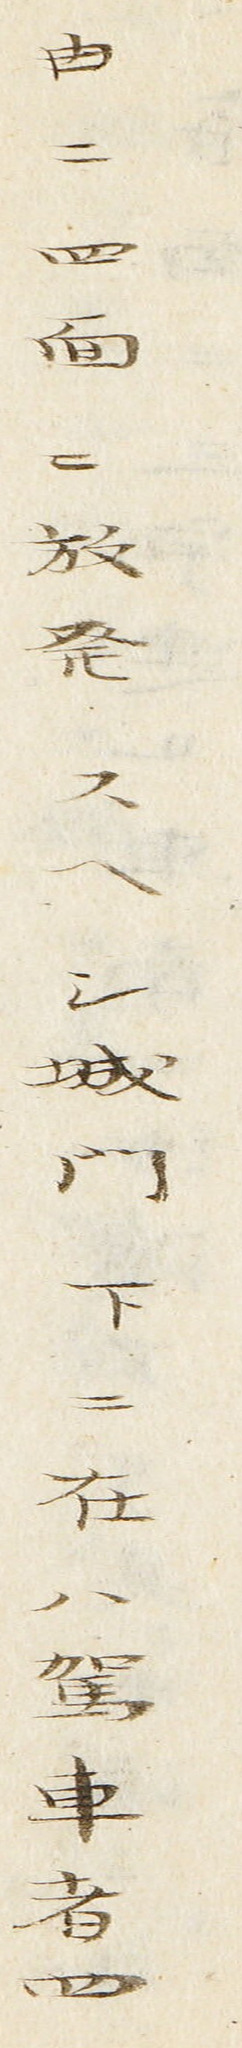由ニ四面ニ放発スヘシ城門下ニ在ハ駕車者四
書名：流蕃通書
